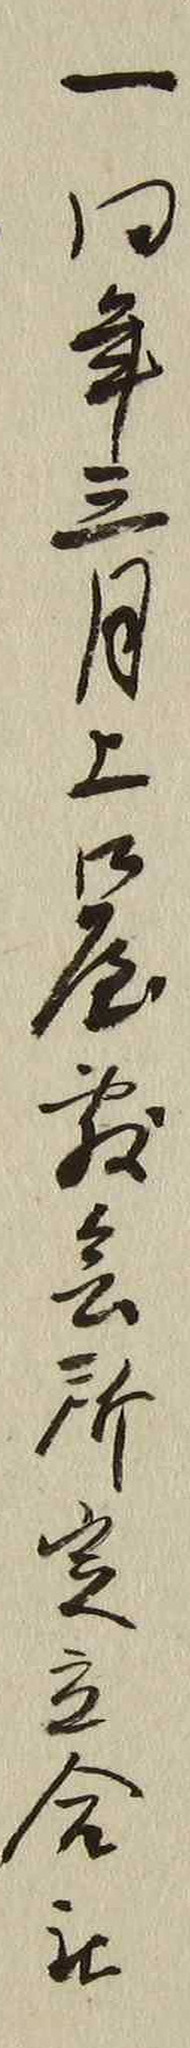一同年三月上御屋敷会所定立合被
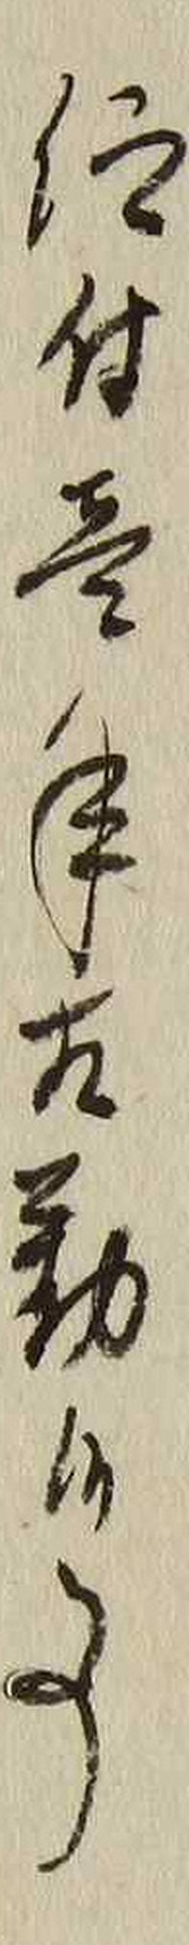仰付壱年相勤候事
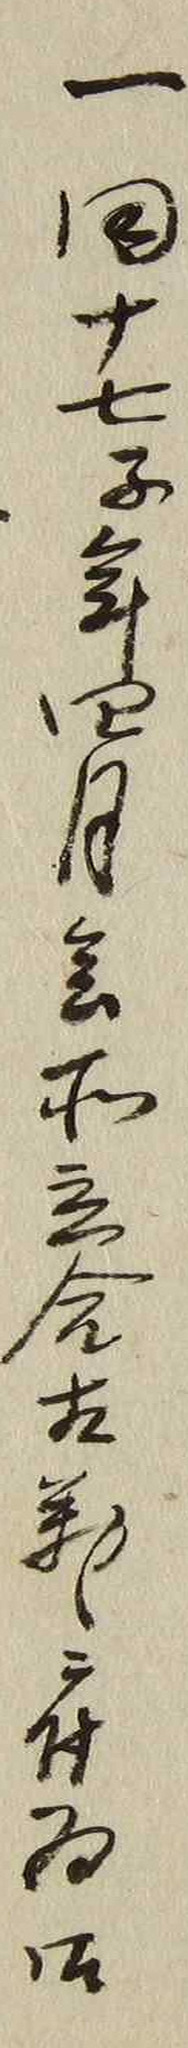一同十七子年四月会所立合相勤候ニ付為御
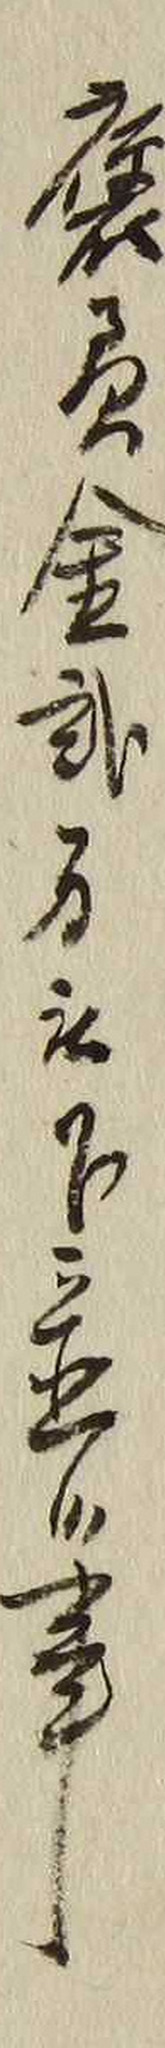褒美金弐分被下置候事
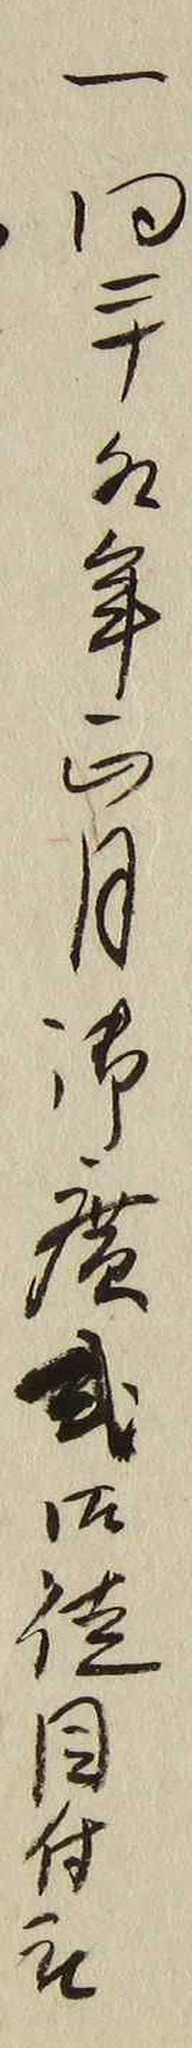一同二十卯年正月御広式御徒目付被
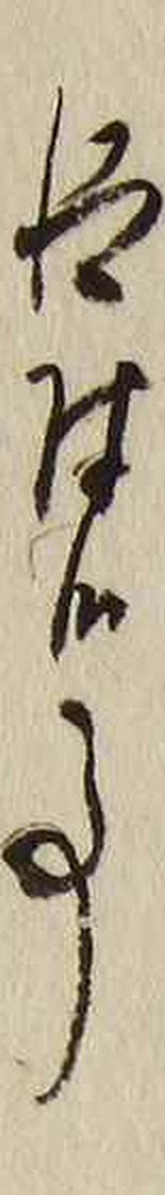仰付候事
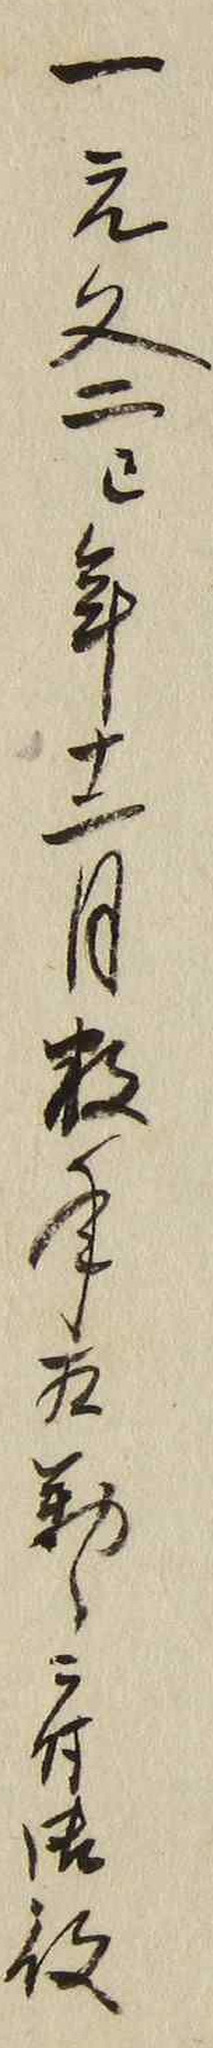一元文二巳年十二月数年相勤候ニ付御役

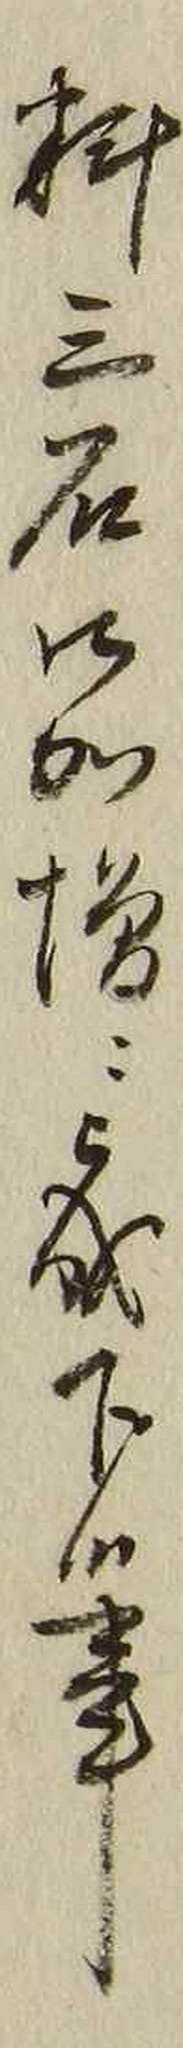料三石御加増ニ被成下候事
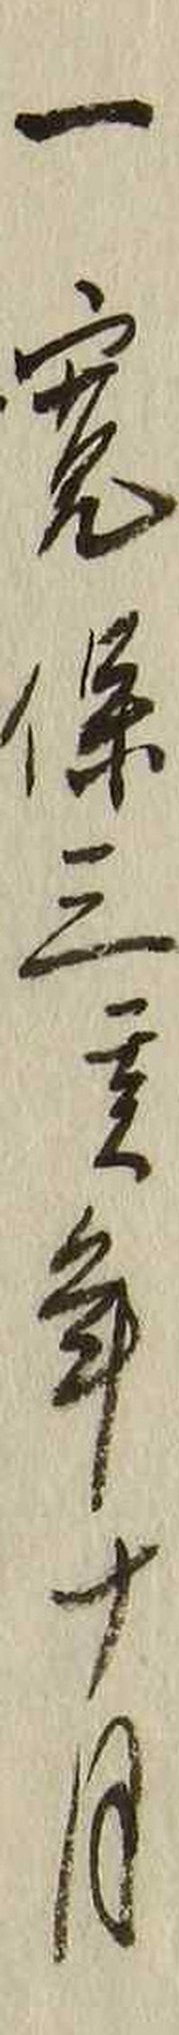一寛保三亥年十月
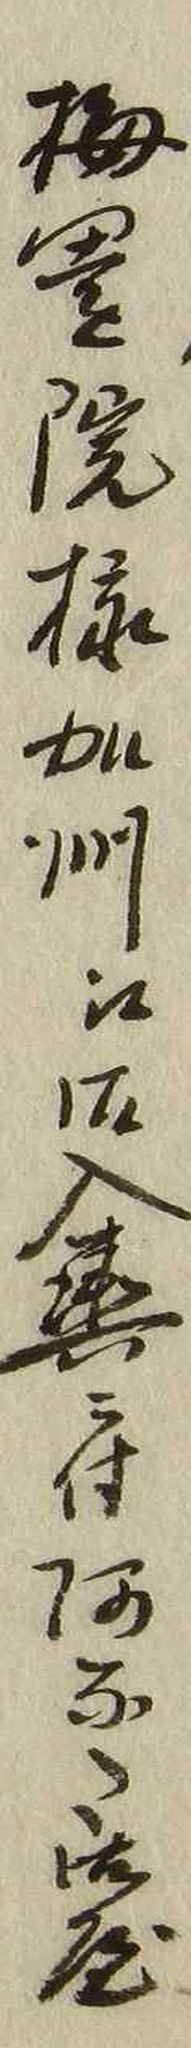梅園院様加州江御入輿ニ付あなた御屋
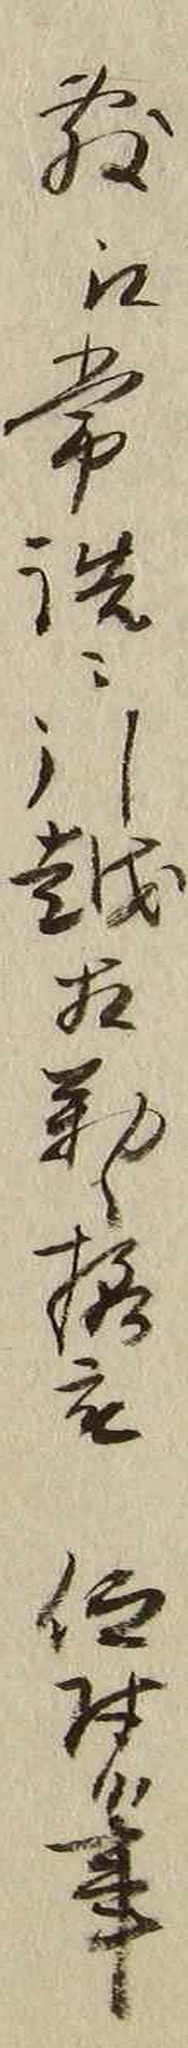敷江常詰ニ引越相勤候様被仰付候事
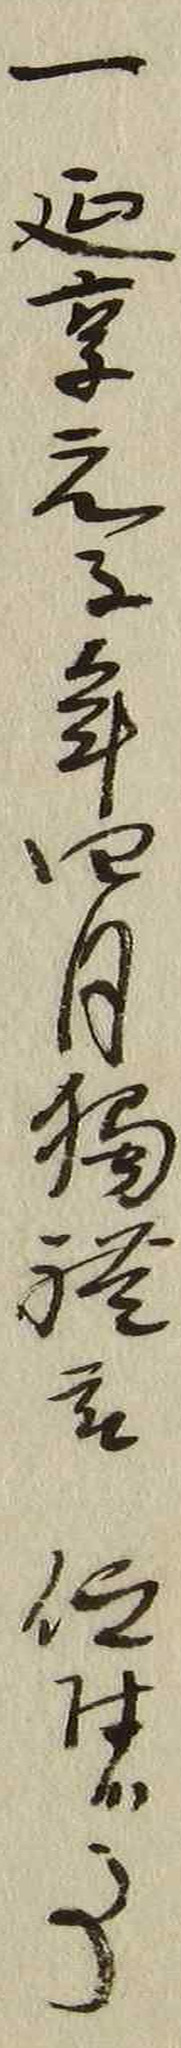一延享元子年四月独礼被仰付候事
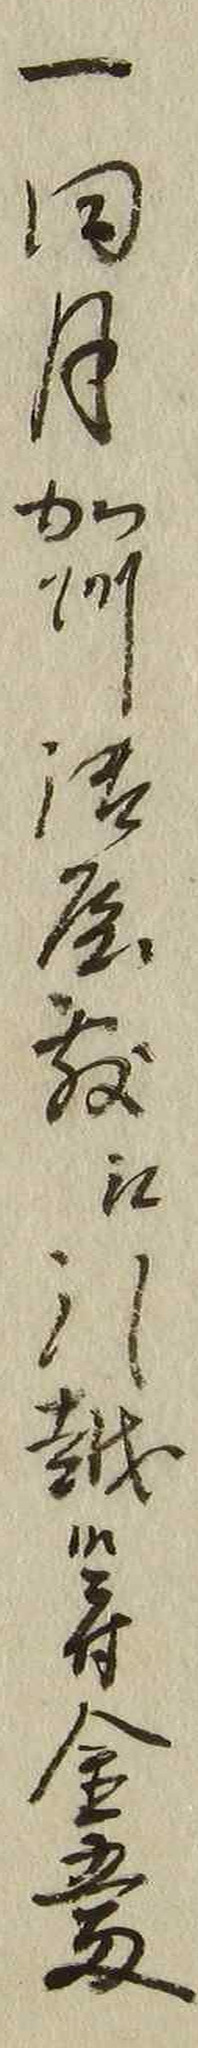一同月加州御屋敷江引越候ニ付金五両
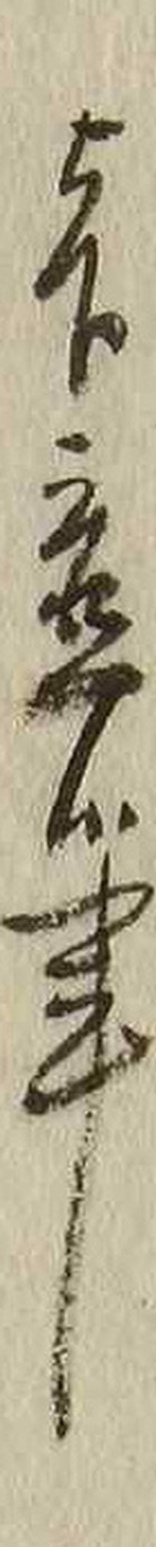被下置候事
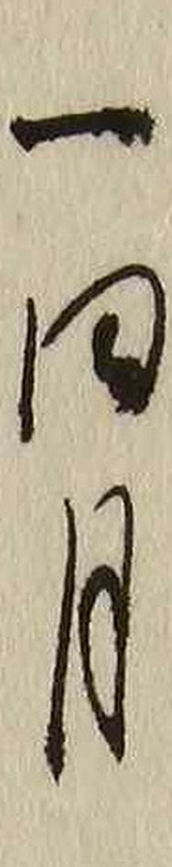一同月
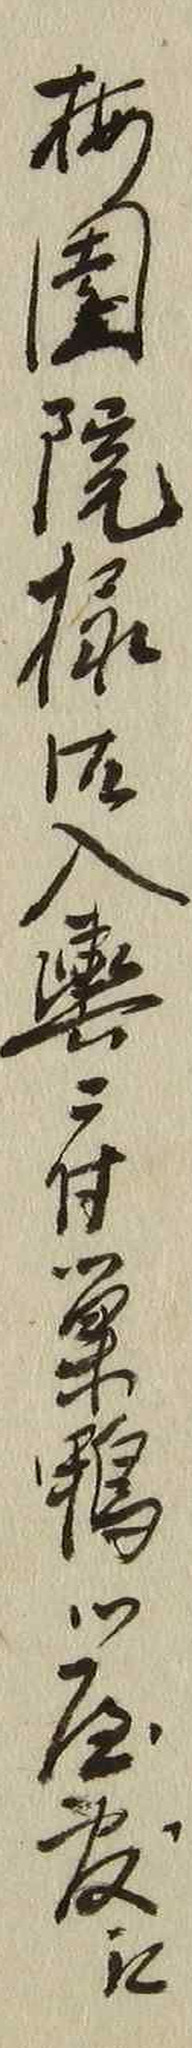梅園院様御入輿ニ付巣鴨御屋敷江
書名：諸士系譜　巻之353　す之部3
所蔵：会津若松市立会津図書館
